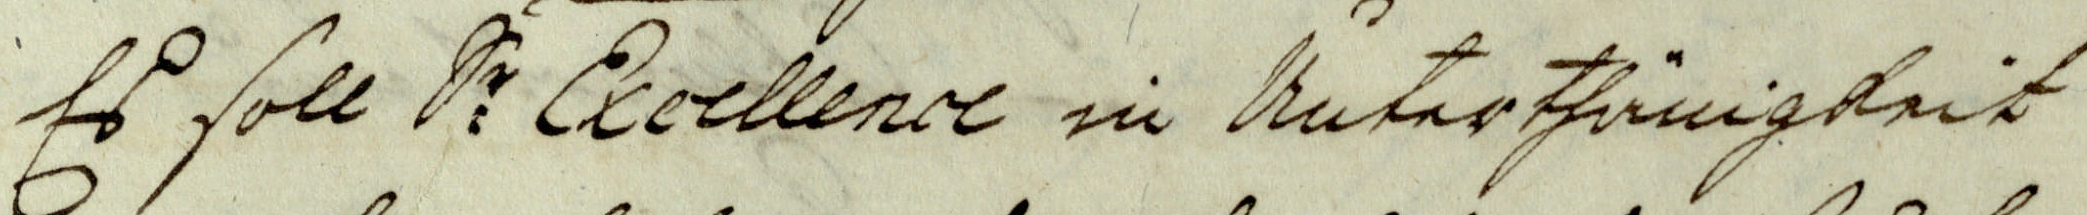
Es soll Sr. Excellence in Unterthänigkeit
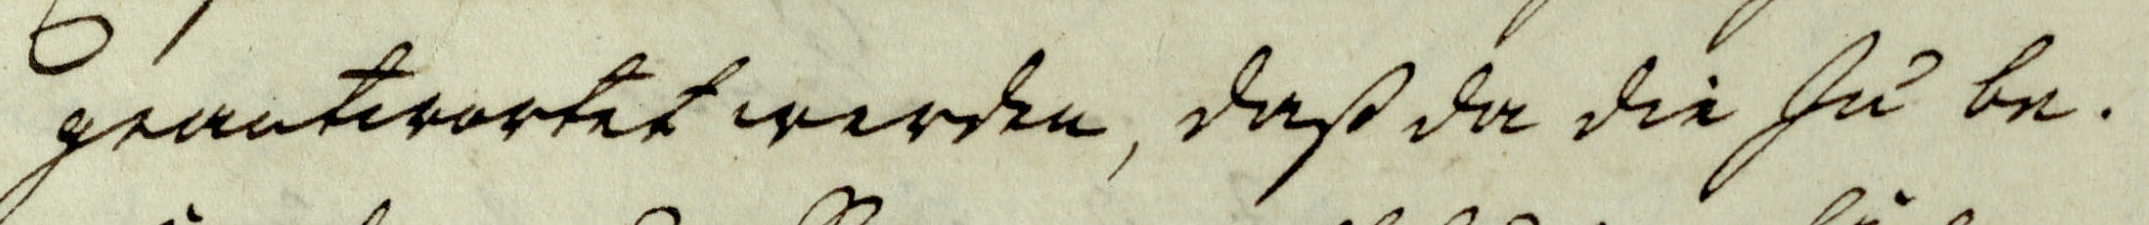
geantwortet werden, daß da die zu be¬
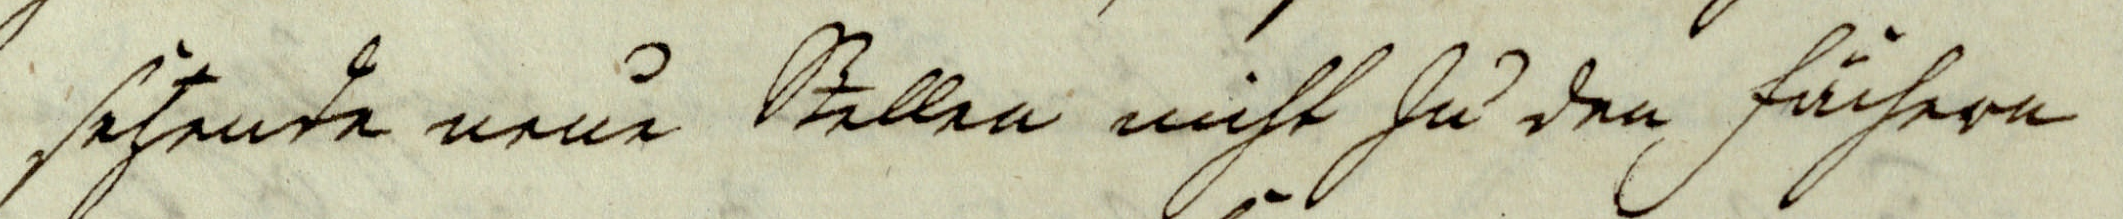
setzende neue Stellen nicht zu den Fächern
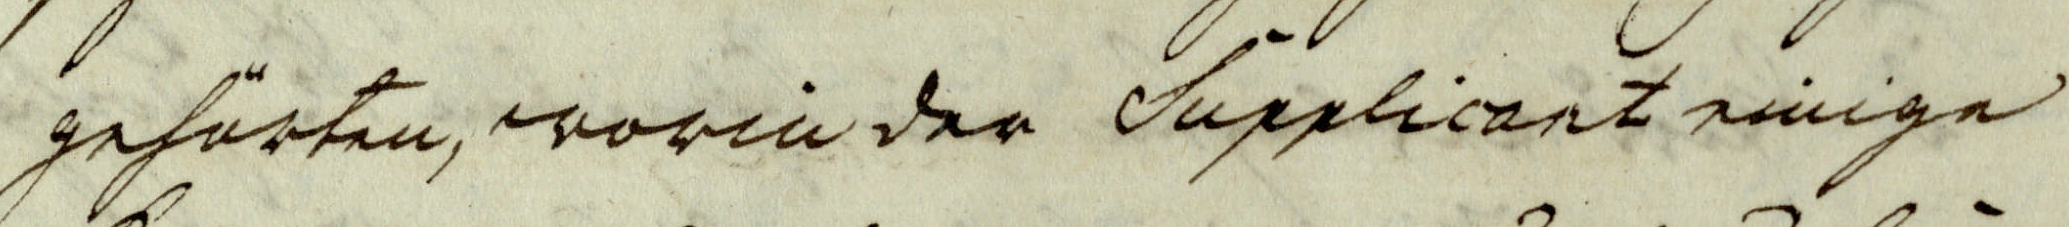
gehörten, worin der Supplicant einige
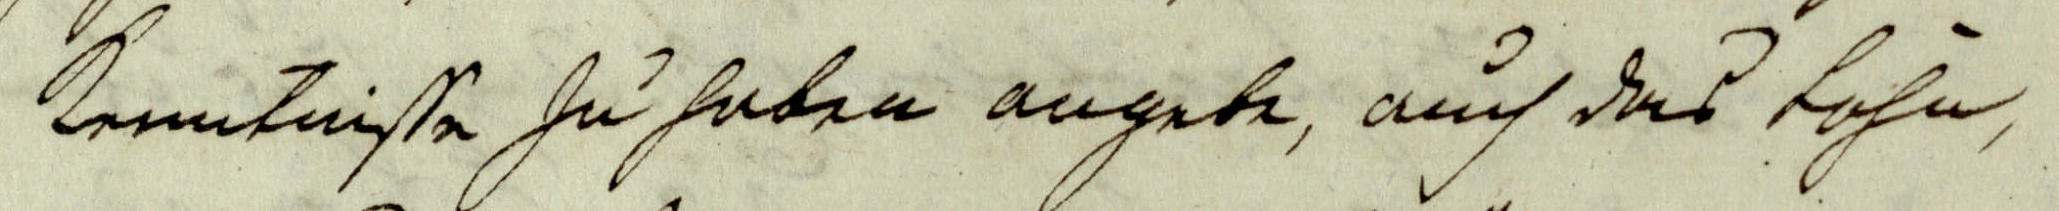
Kenntnisse zu haben angebe, auch das Lohn,
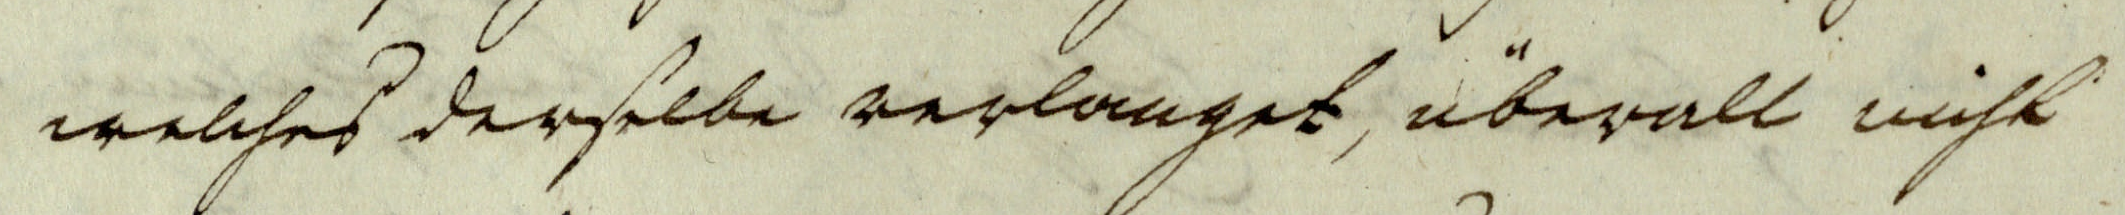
welches derselbe verlanget, überall nicht
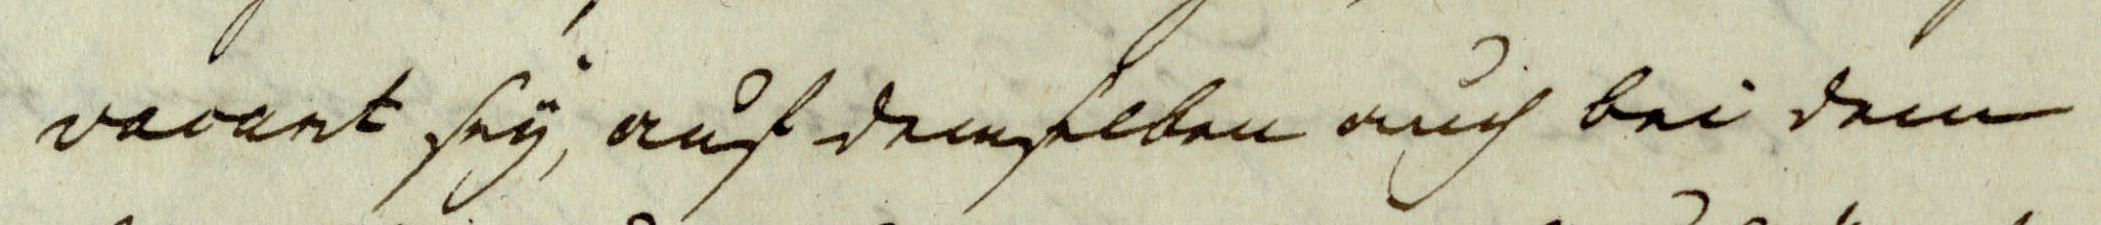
vacant seÿ, auf demselben auch bei dem
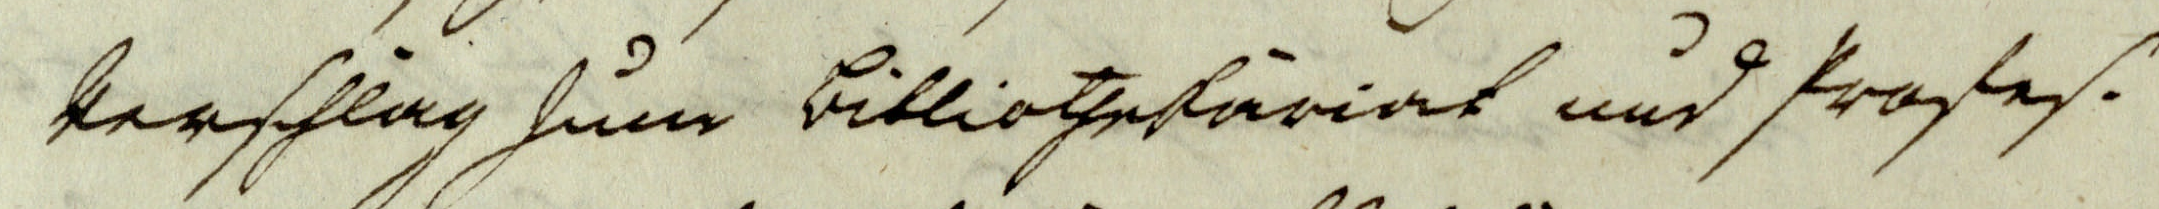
Verschlag zum Bibliothekariat und Profes¬
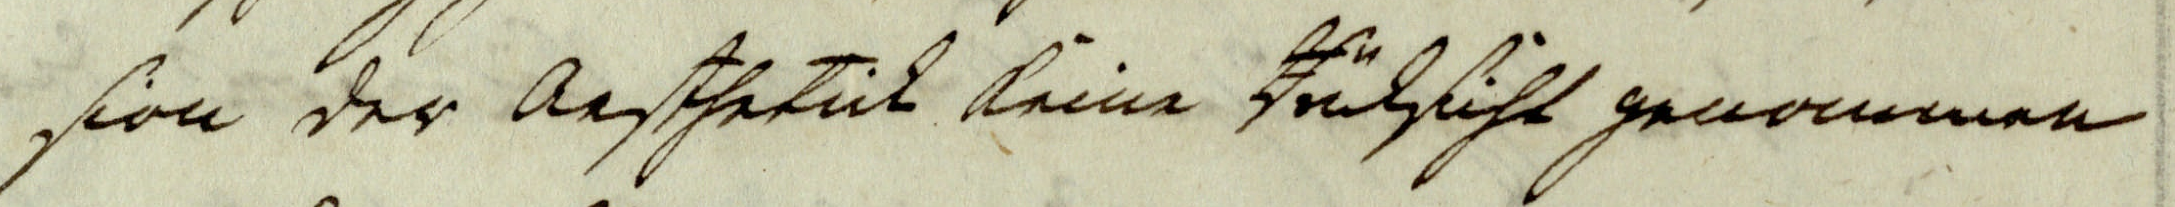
sion der Aesthetick keine Rücksicht genommen
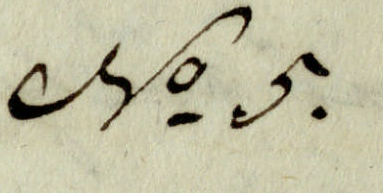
No 5.
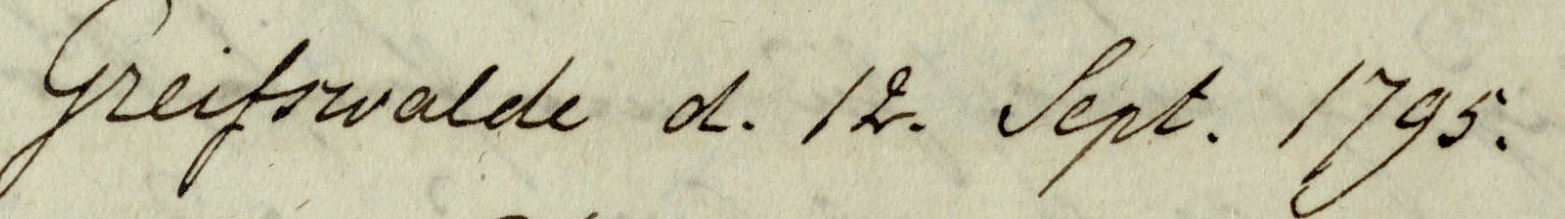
Greifswalde d. 12. Sept. 1795.
